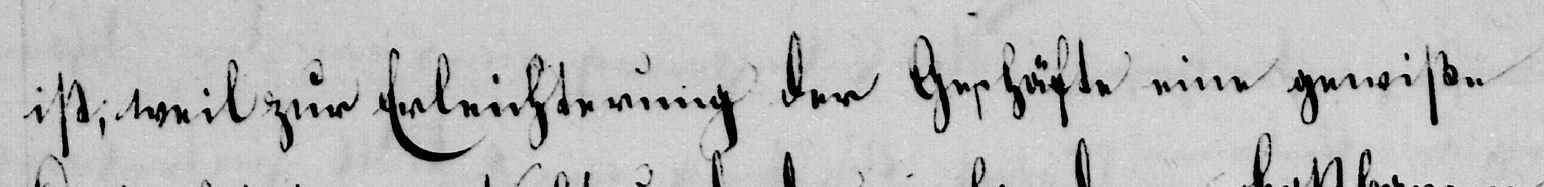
ist, weil zur Erleichterung der Geschäfte eine gewiße
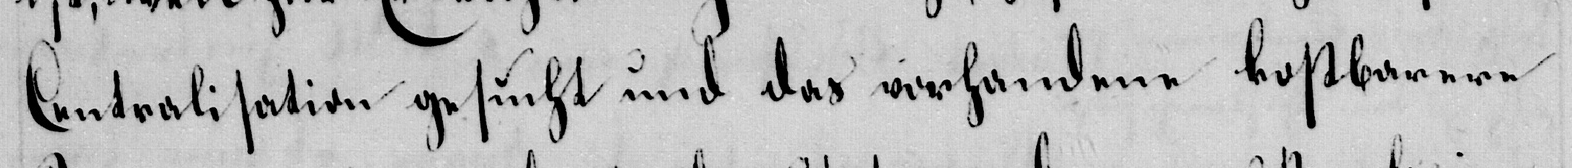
Centralisation gesucht und das vorhandene kostbarere
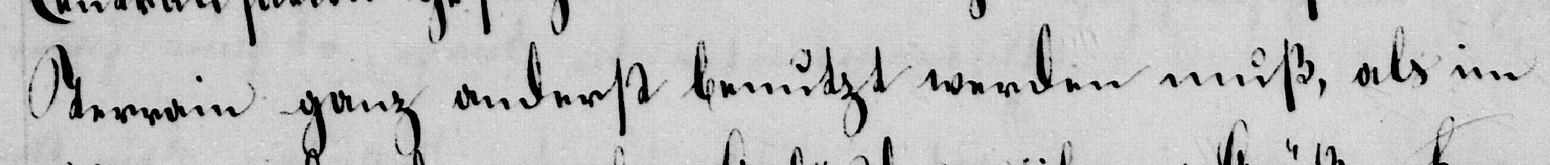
Terrain ganz anderst benutzt werden muß, als im
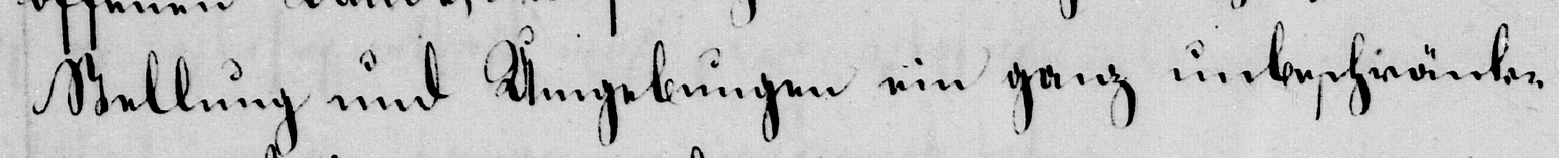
Stellung und Umgebungen ein ganz unbeschränk¬
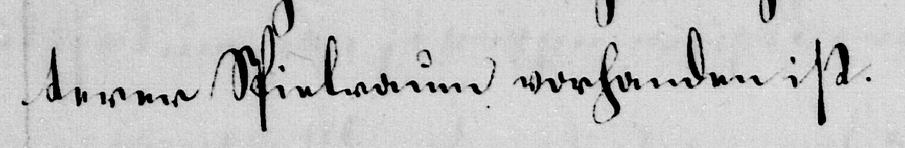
terer Spielraum vorhanden ist.
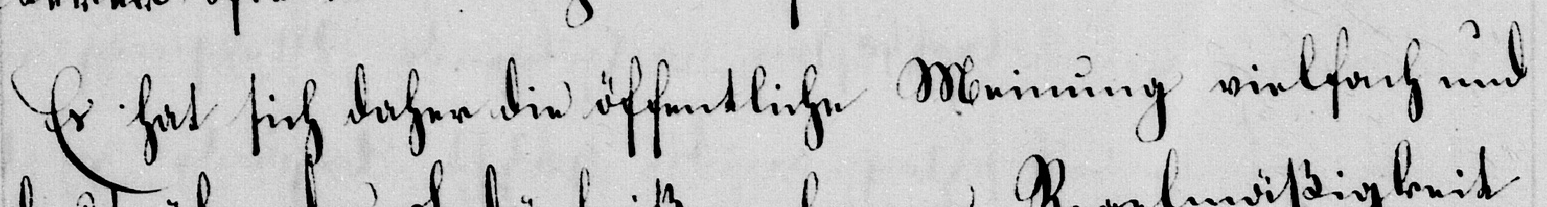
Es hat sich daher die öffentliche Meinung vielfach und
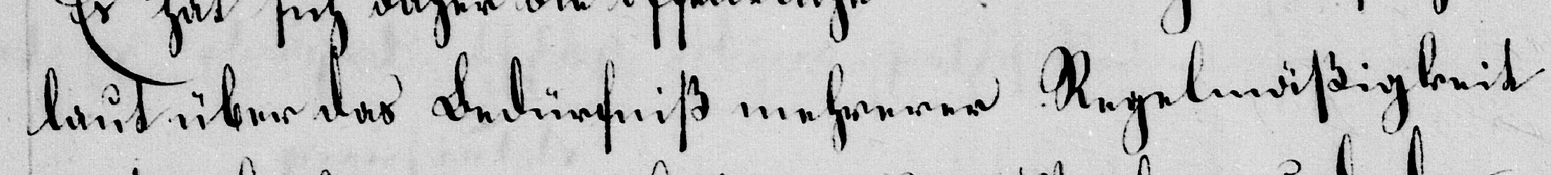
laut über das Bedürfniß mehrerer Regelmäßigkeit
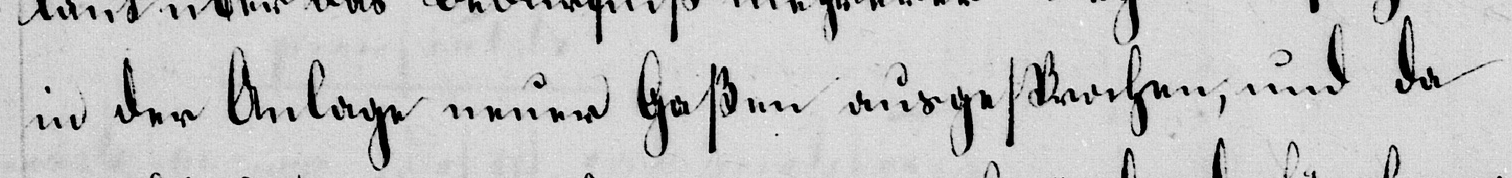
in der Anlage neuer Gaßen ausgesprochen, und da
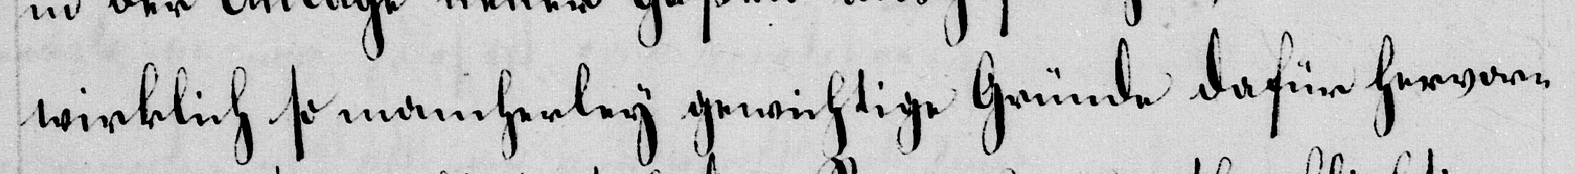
wirklich so mancherley gewichtige Gründe dafür hervor¬
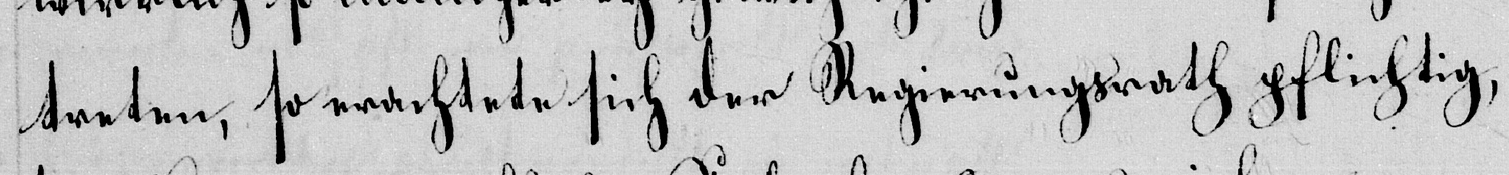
treten, so erachtete sich der Regierungsrath pflichtig,
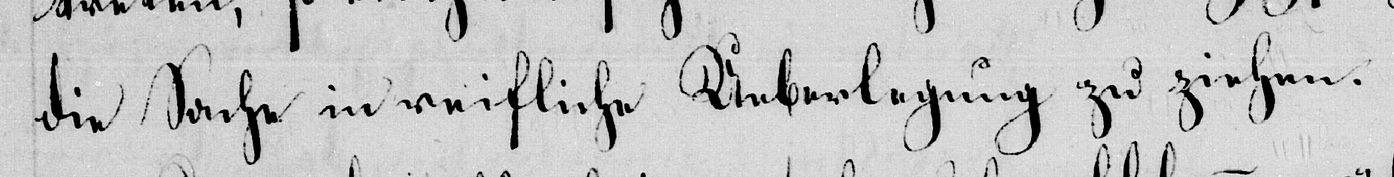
die Sache in reifliche Ueberlegung zu ziehen.
